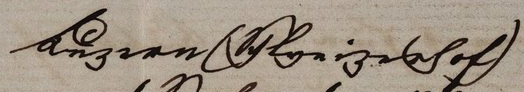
Luzern (Schweizerhof)
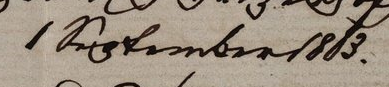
1 September 1863.
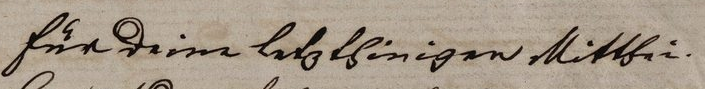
Für Deine letzthinigen Mitthei-
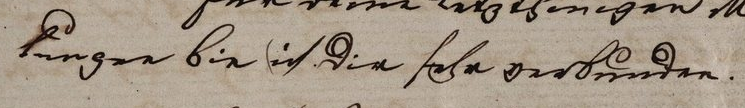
lungen bin ich Dir sehr verbunden.
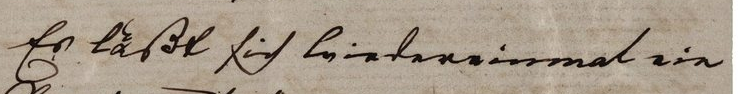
Es läßt sich wiedereinmal ein
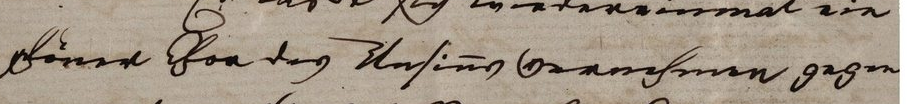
schöner Chor des Unsinns vernehmen gegen
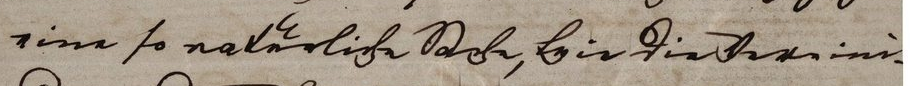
eine so natürliche Sache, wie die Vereini-
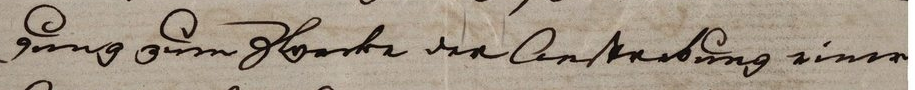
gung zum Zwecke der Anstrebung einer
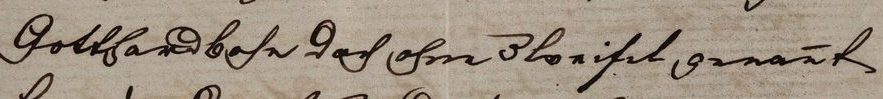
Gotthardbahn doch ohne Zweifel genannt
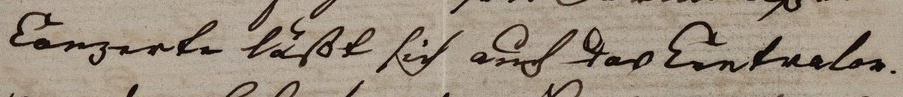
Conzerte läßt sich auch das Centralor-
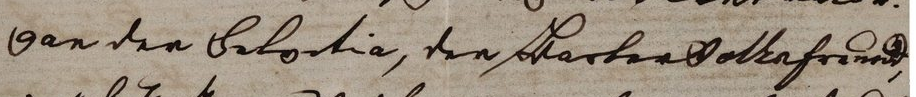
gan der Helvetia, der Baslervolksfreund
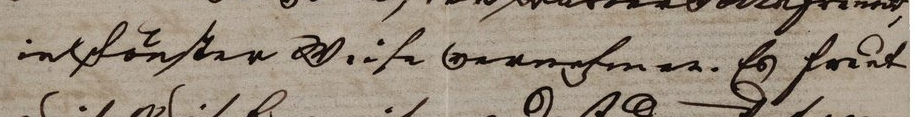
in schönster Weise vernehmen. Es freut
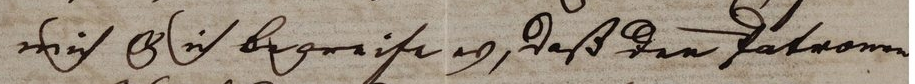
mich & ich begreife es, daß den Patronen
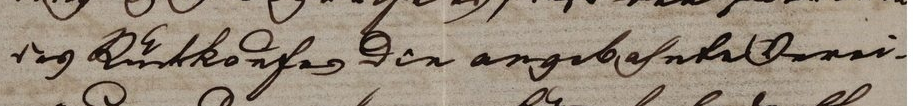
des Rückkaufes die angebahnte Verei-
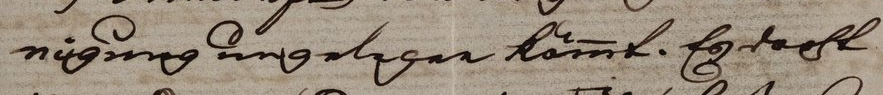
nigung ungelegen kömmt. Es droht
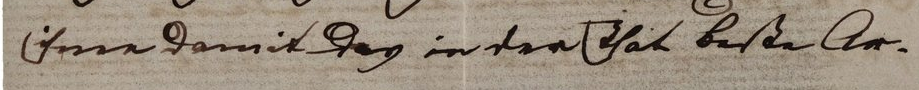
ihnen damit das in der That beste Ar-
